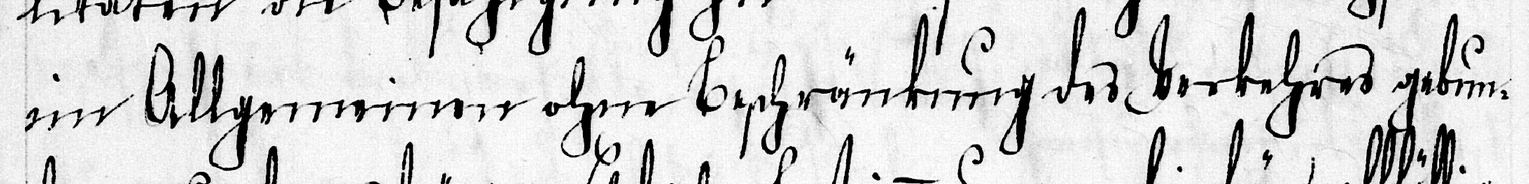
im Allgemeinen ohne Beschränkung des Verkehers gebun¬
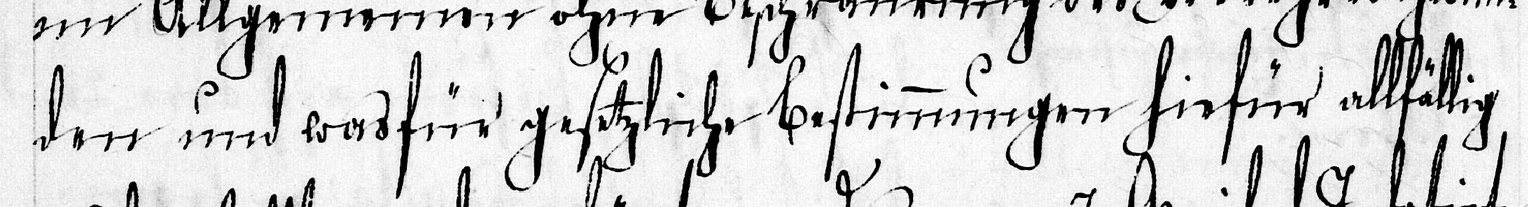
den und was für gesetzliche Bestimmungen hiefür allfäl¬
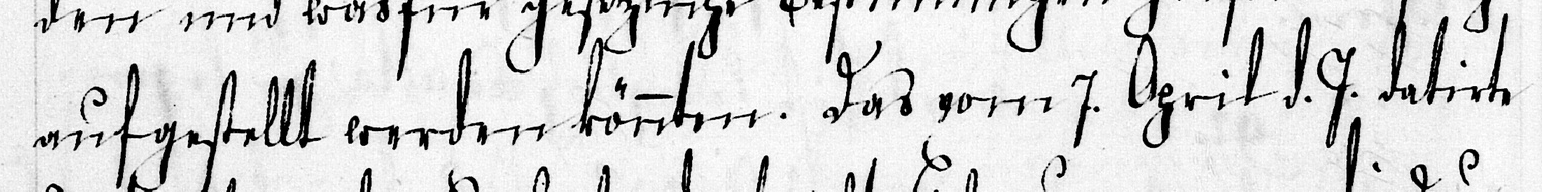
aufgestellt werden könnten. Das vom 7. April d. J. datirte
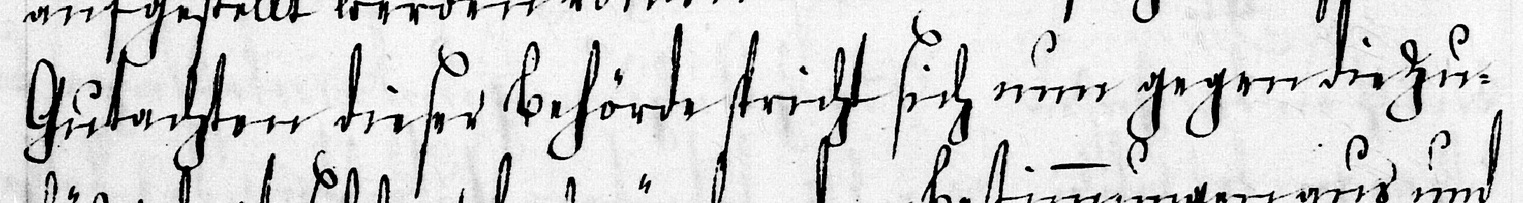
Gutachten dieser Behörde spricht sich nun gegen die Zu¬
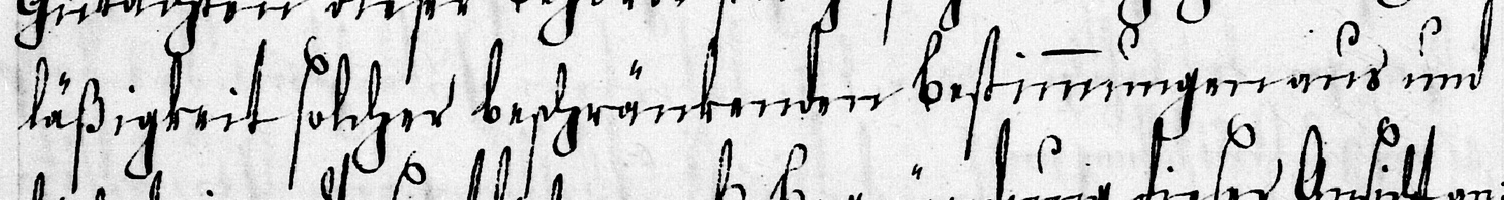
läßigkeit solcher beschränkenden Bestimmungen aus und
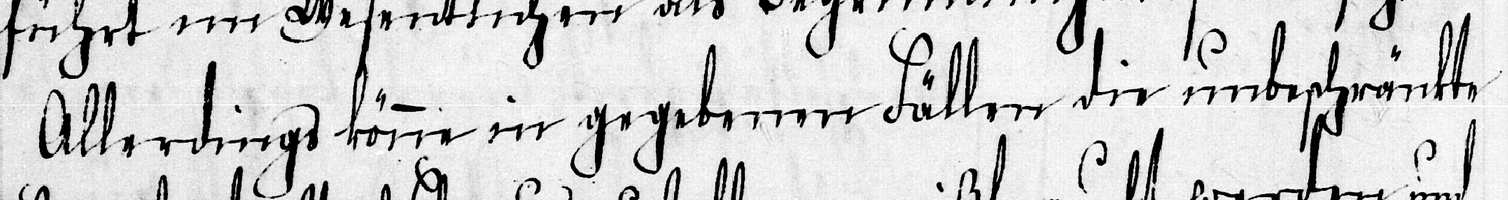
Allerdings könne in gegebenen Fällen die unbeschränkte
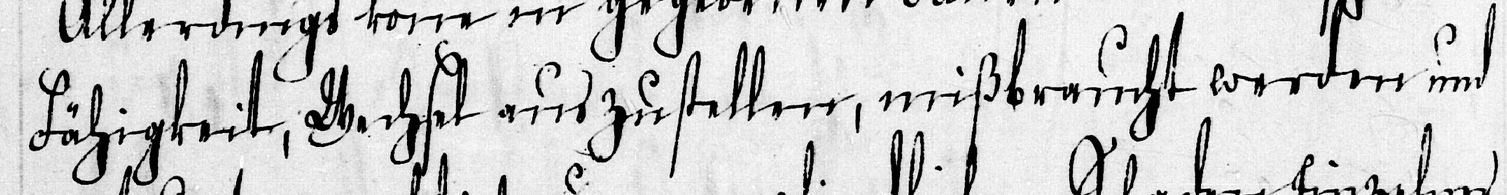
Fähigkeit, Wechsel auszustellen, mißbraucht werden und
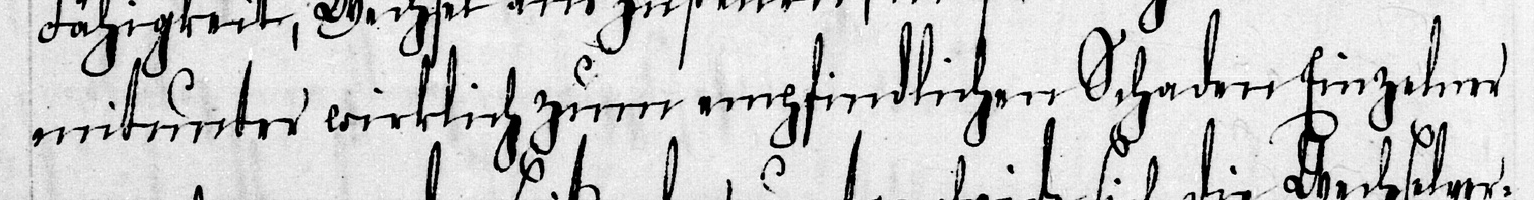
mitunter wirklich zum empfindlichen Schaden Einzelner
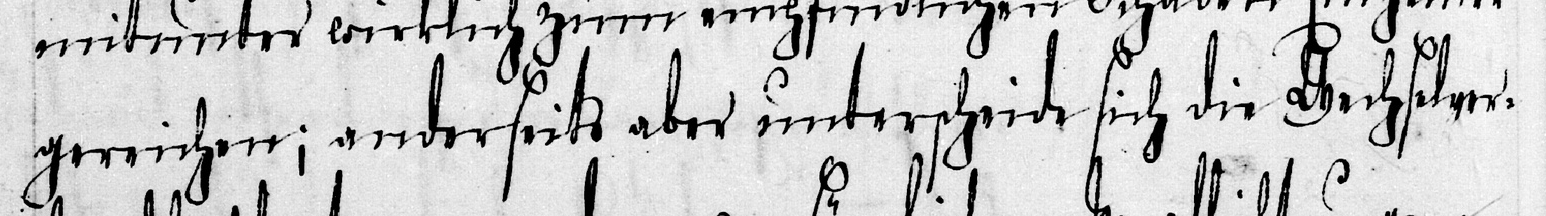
gereichen; anderseits aber unterscheide sich die Wechselver¬
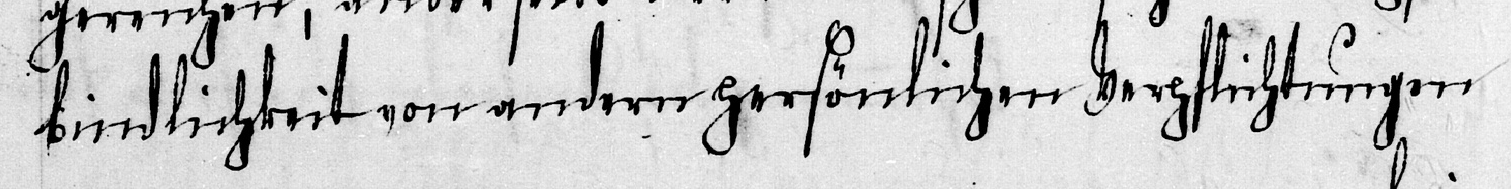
bindlichkeit von andern persönlichen Verpflichtungen
